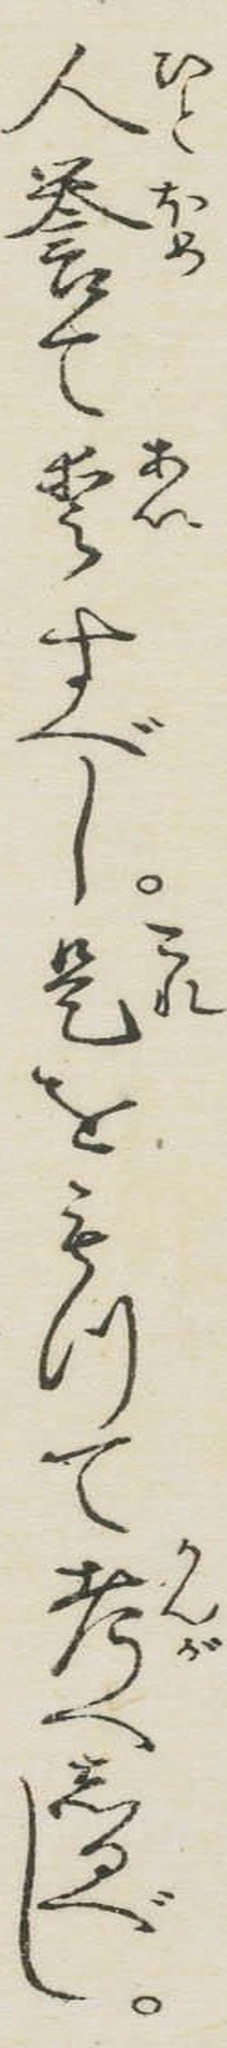人誉て愛すべし。是をもつて考へしるべし。
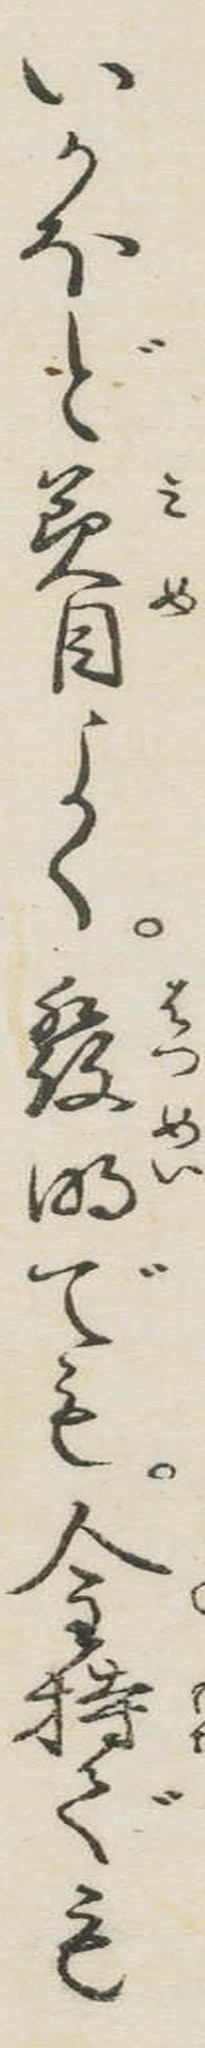いかほど美目よく。発明でも。金持でも
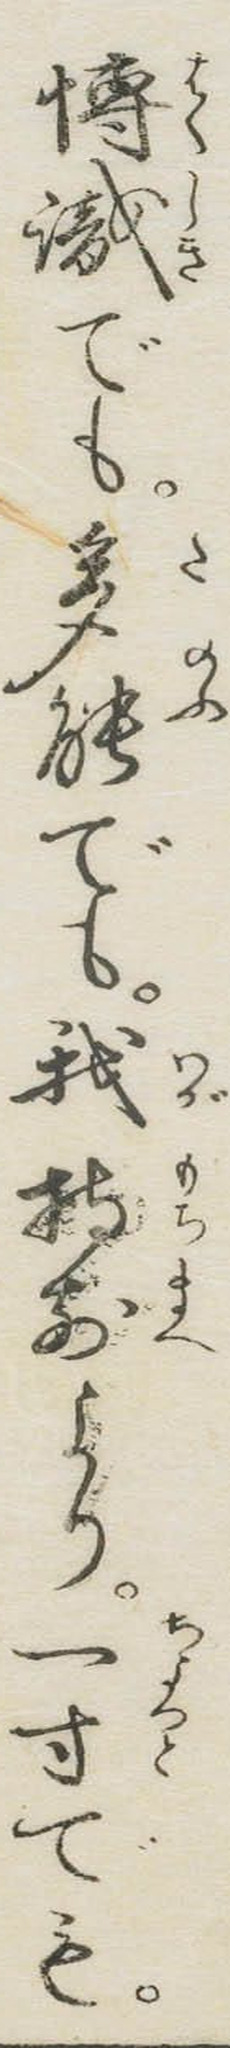博識でも。多能でも。我持前より。一寸でも。
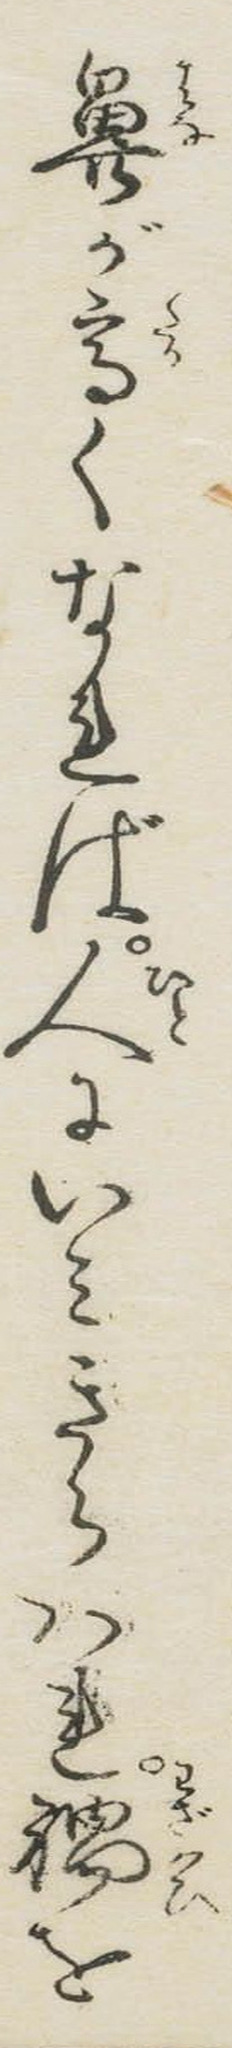鼻が高くなれば。人にいみきらはれ。禍を
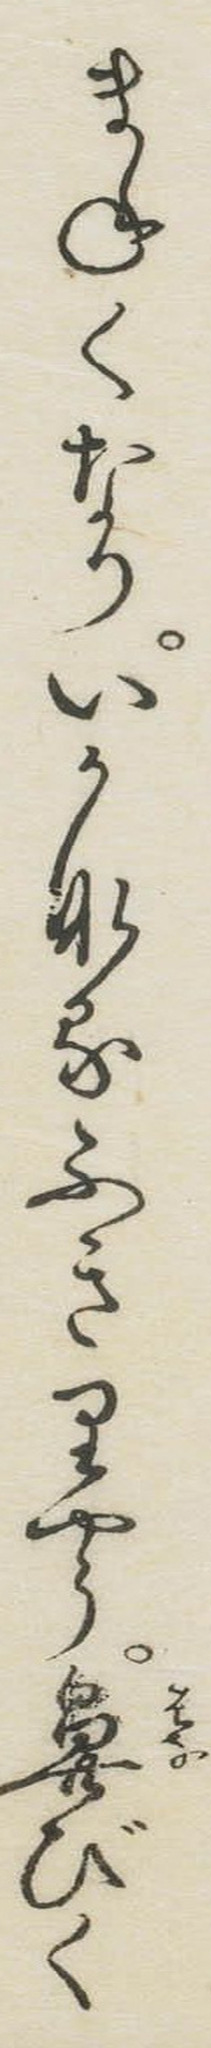まねくなり。いかなるふきりやう。鼻びく
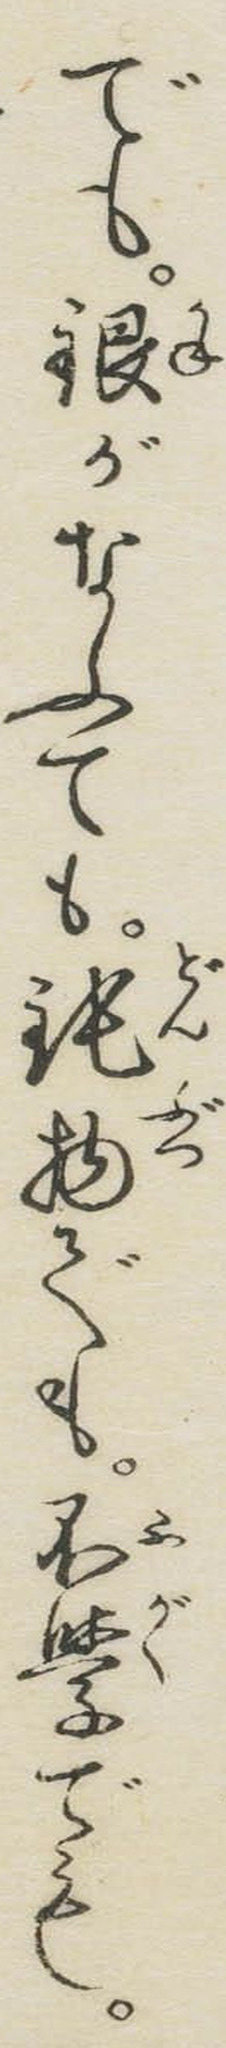でも。銀がなふても。鈍物でも。不学でも。
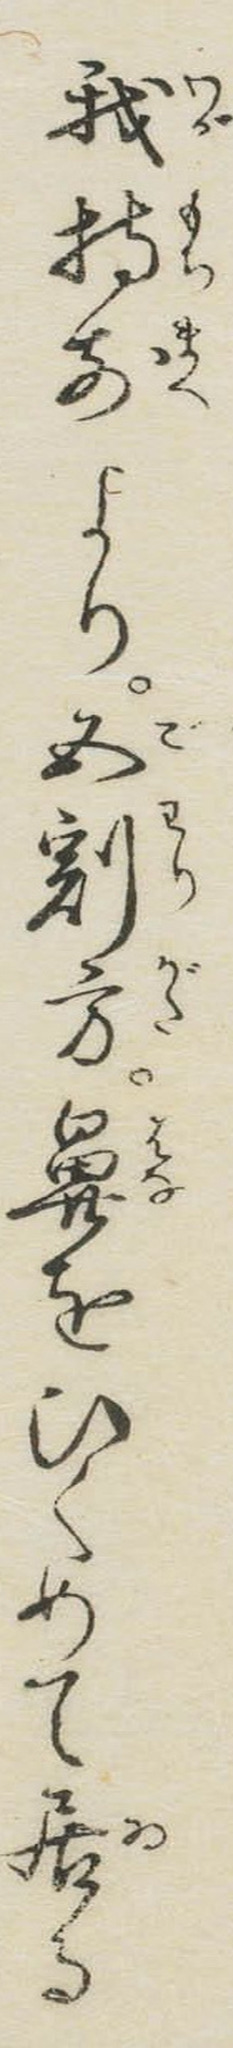我持前より。五割方。鼻をひくめて居る
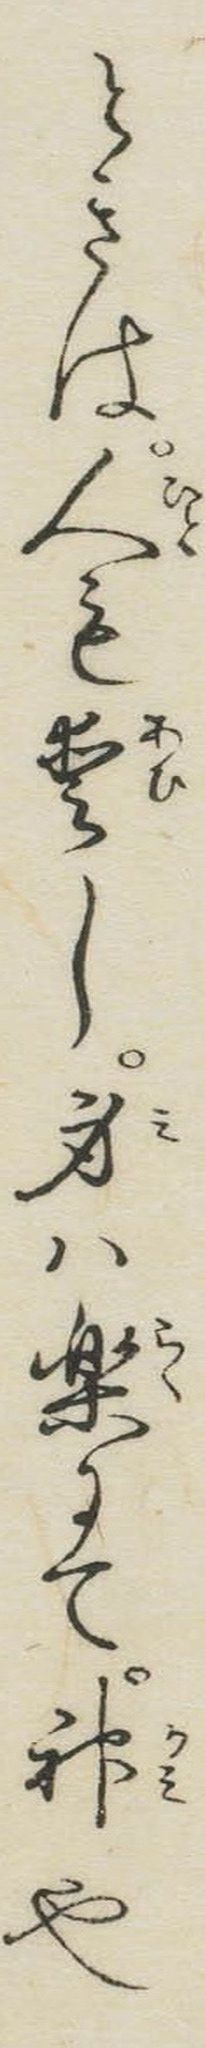ときは。人も愛し。身は楽にて。神や
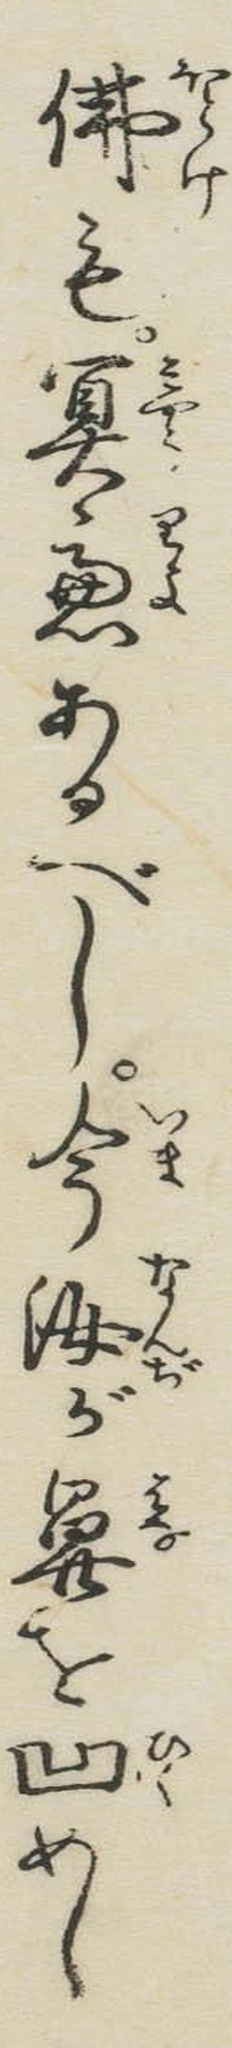仏も。冥慮あるべし。今汝が鼻を凹めし
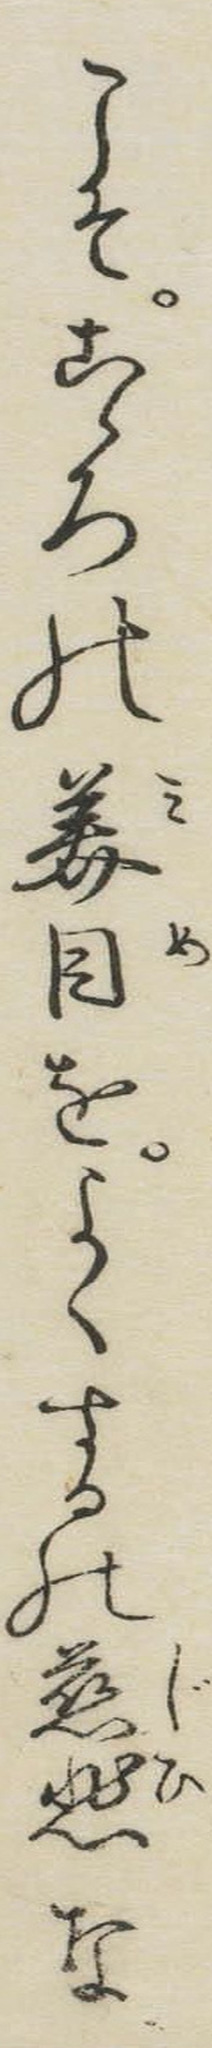こそ。こゝろの美目を。よくするの慈悲な

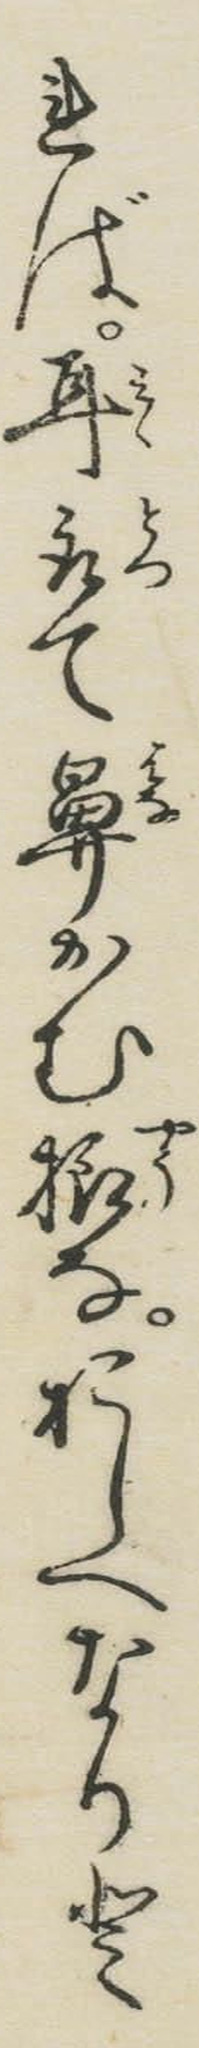れば。耳取て鼻かむ様な。おしへなりと
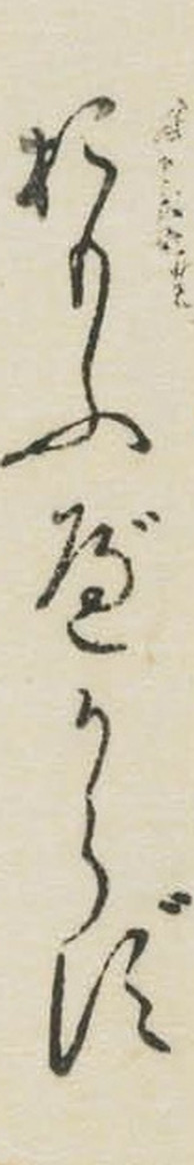おもふべからず
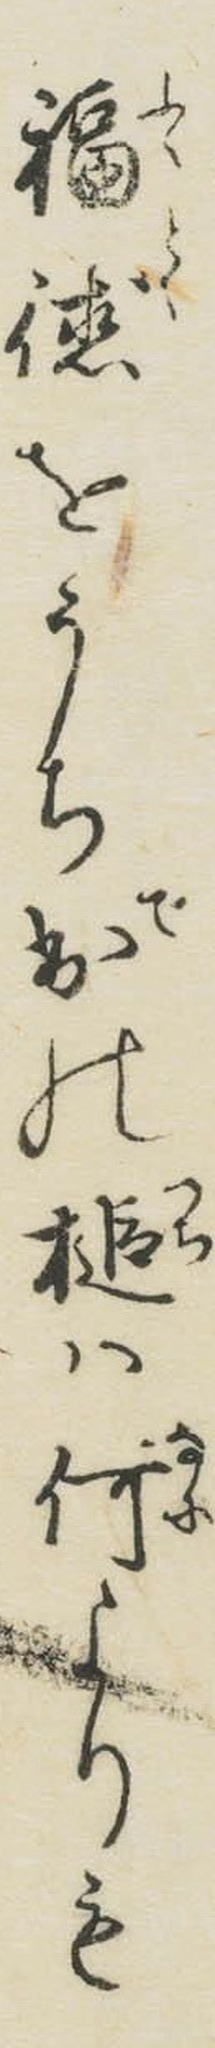福徳をうち出の槌は何よりも
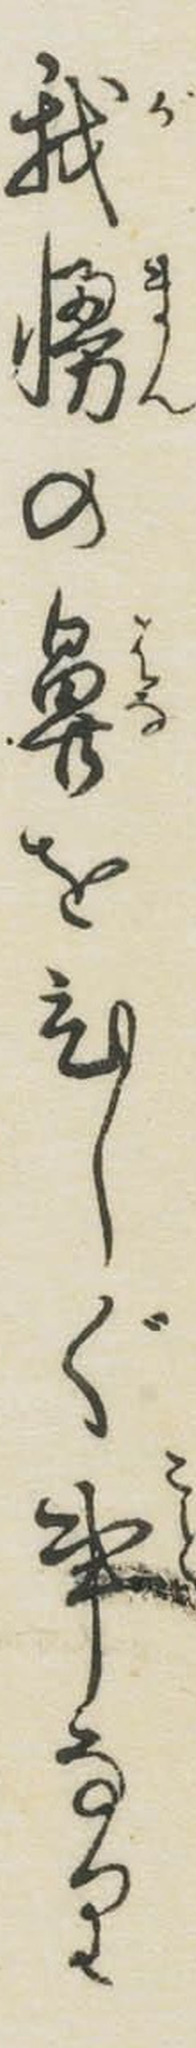我慢の鼻をひしぐ事なり
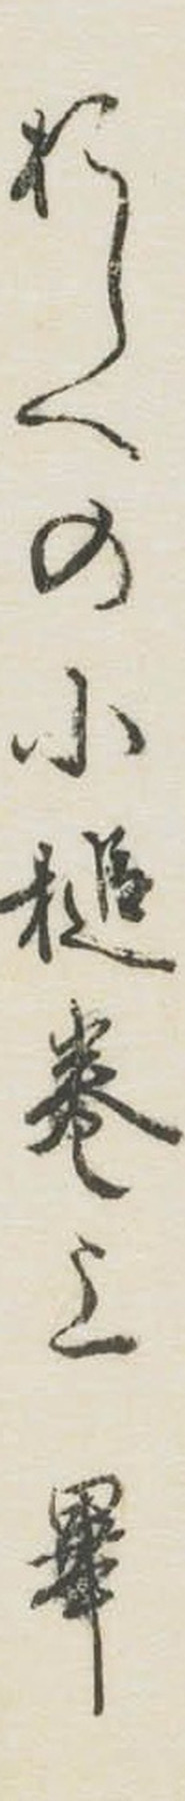おしへの小槌巻上畢
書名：福神おしへの小槌 2巻 上
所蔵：東京学芸大学教育コンテンツアーカイブ
